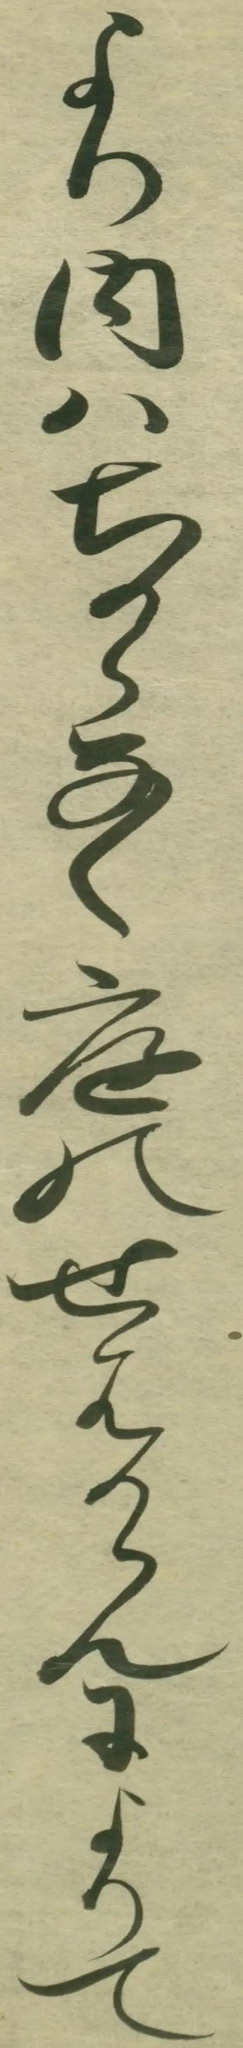より内はちからなく庭のせはからんによりて
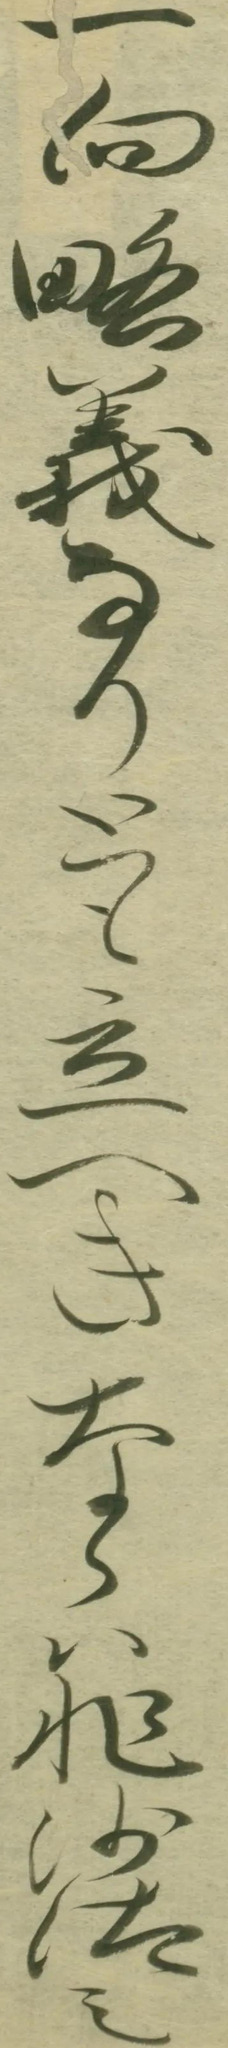一向略義なりとも立へきならは非沙汰之
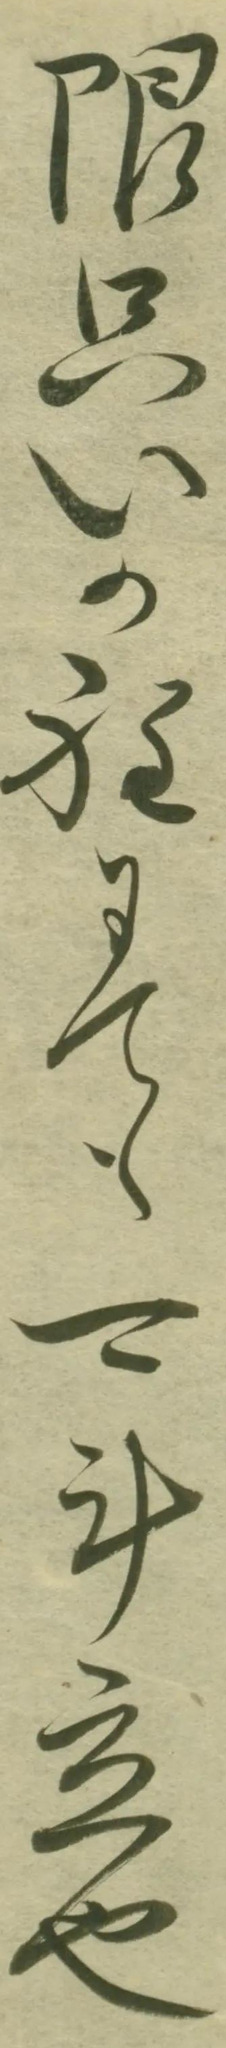限只いか程にても可計立也
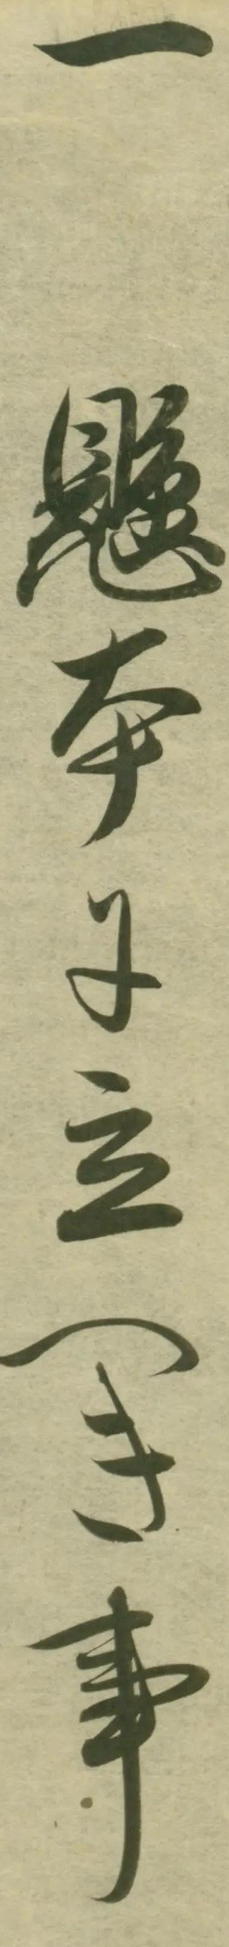一懸本に立へき事
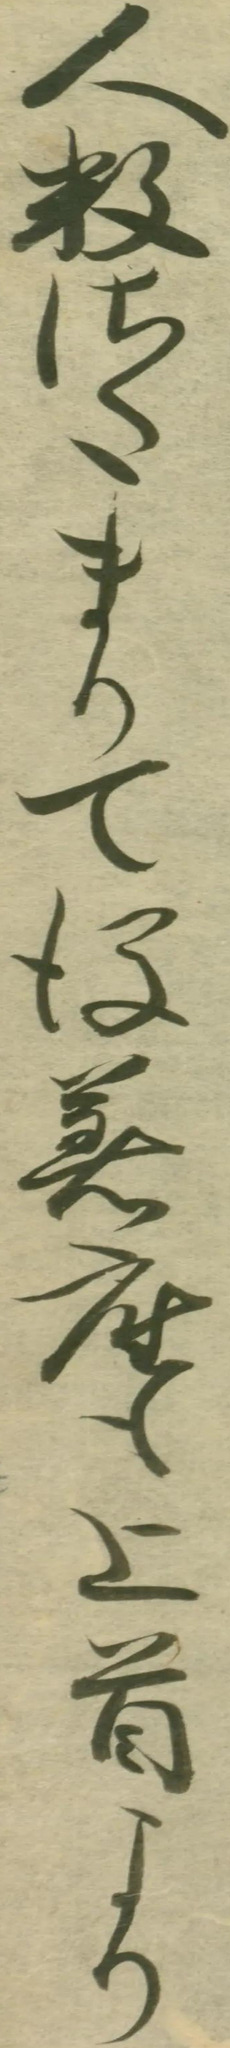人数さたまりて後美座も上首より
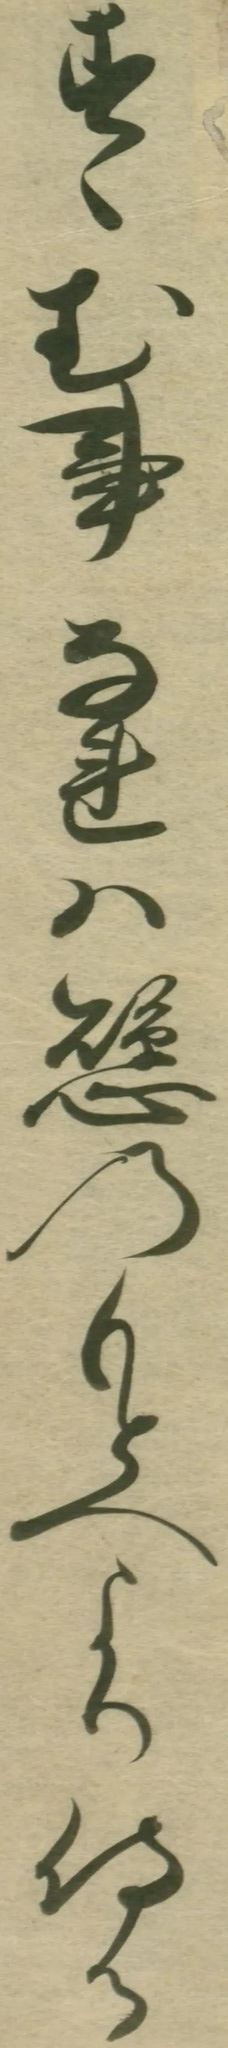すゝむ事なれは懸のもとへより侍る

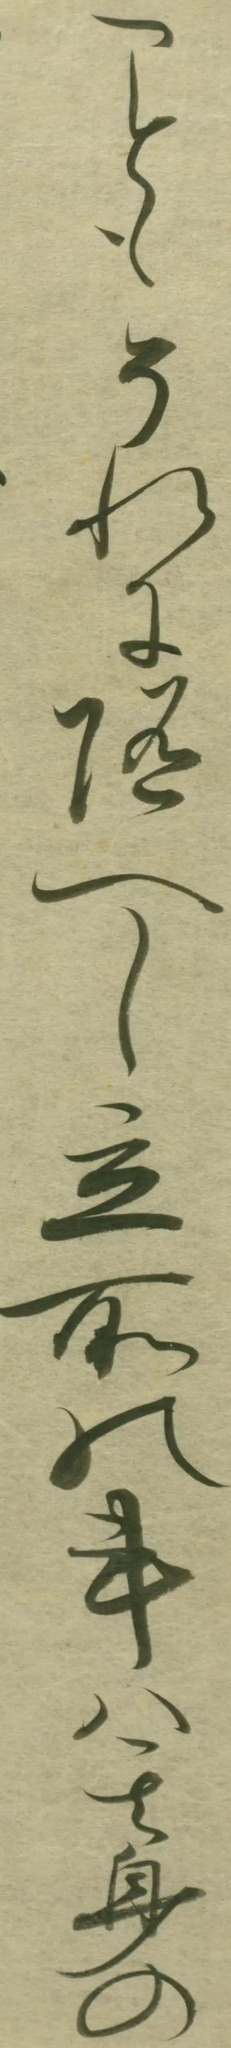こともそれに随へし立所の事は其身の
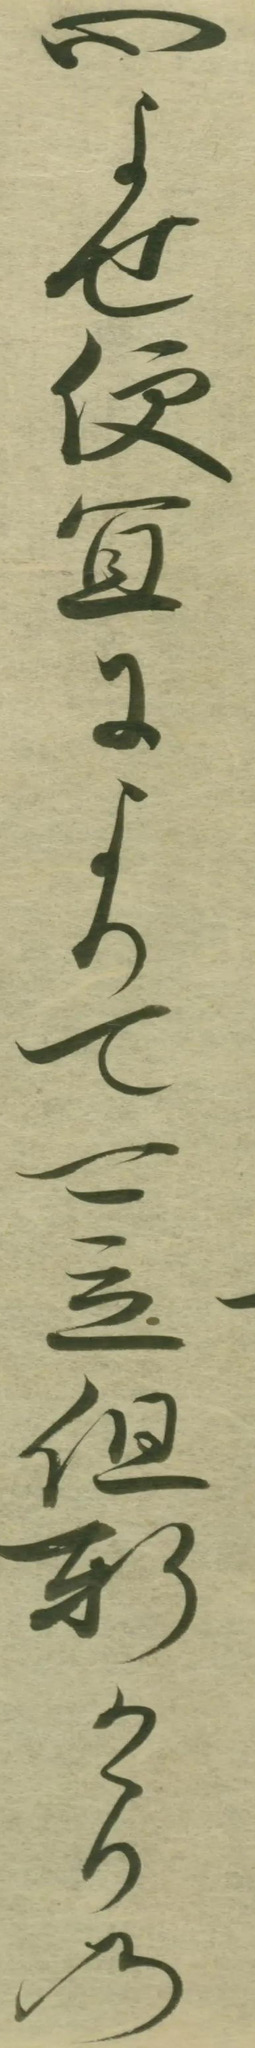心よせ便宜によりて可立但軒かゝりの
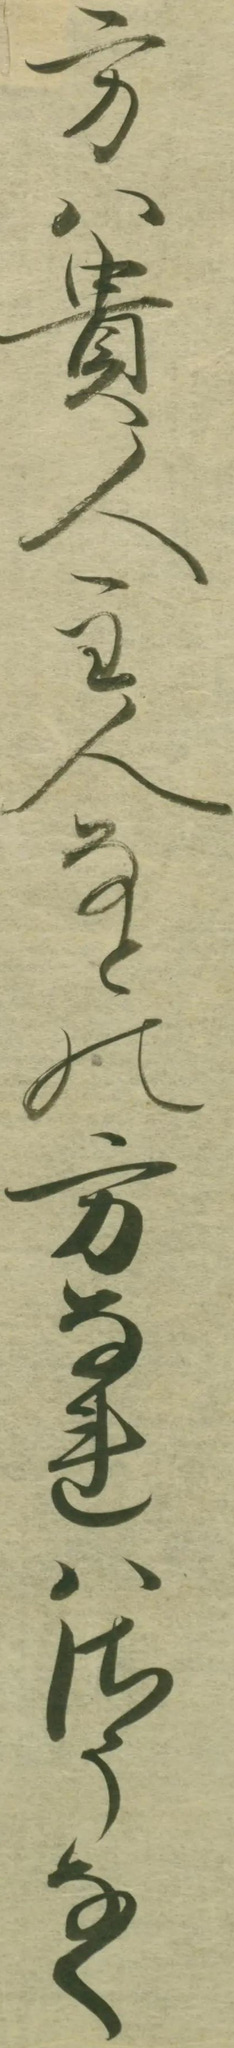方は貴人主人なとの方なれはさうなく
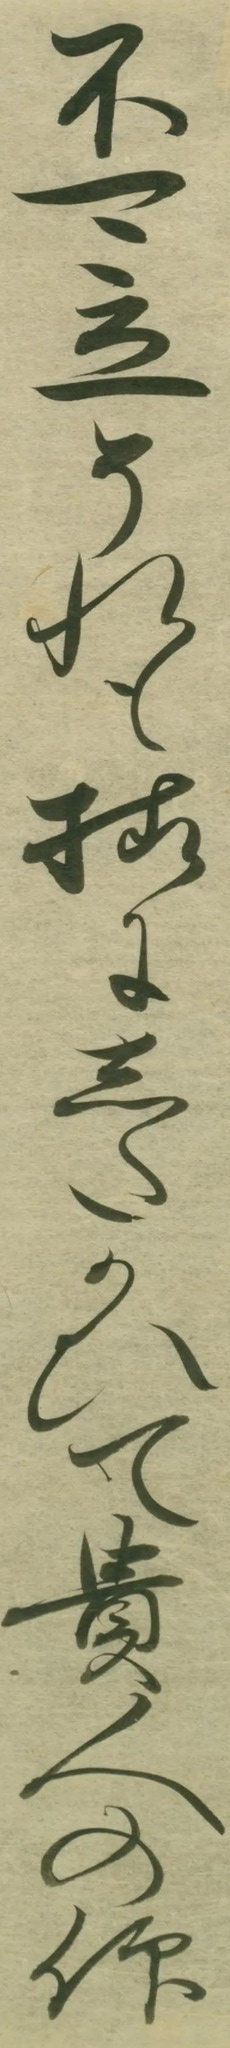不可立それも様にしたかひて貴人の仰
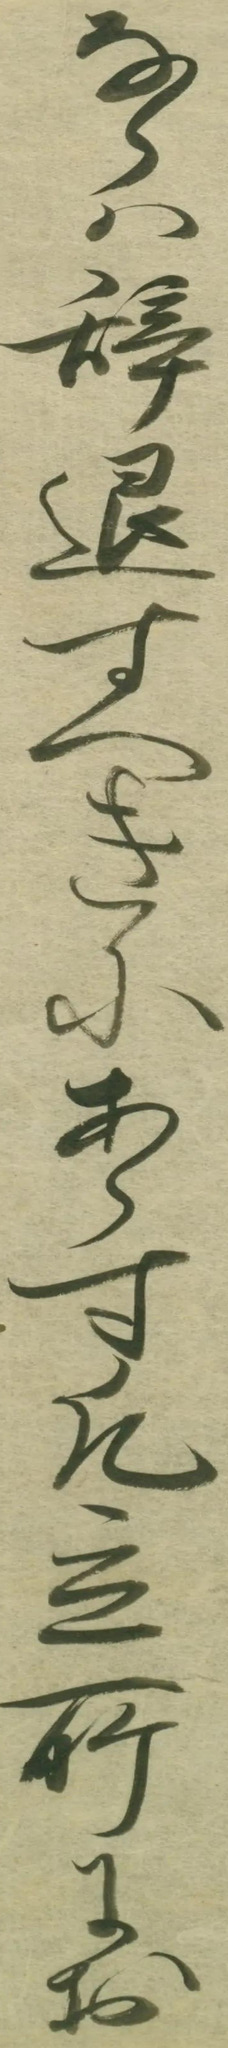ならは辞退すへきにあらす凡立所にお
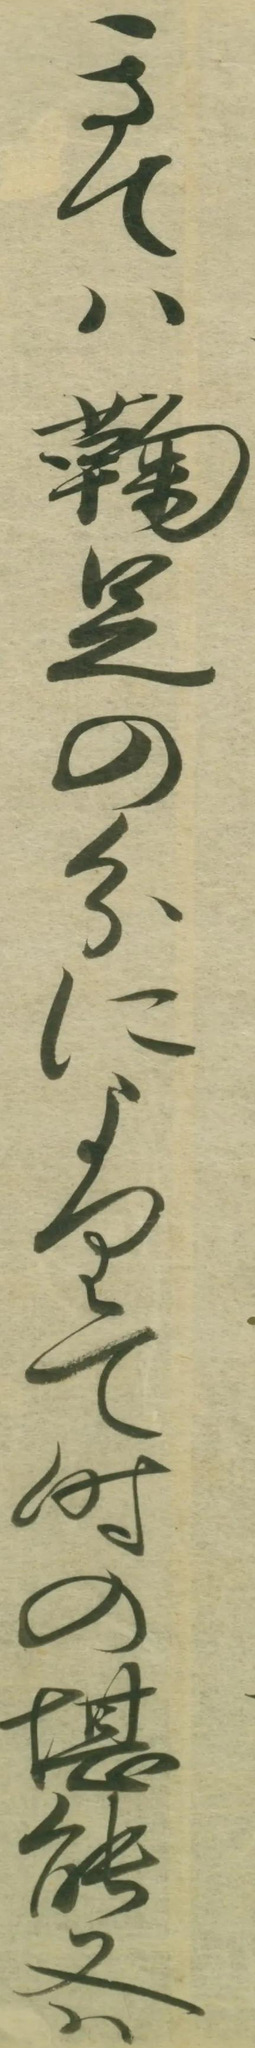きては鞠足の分によりて時の堪能又は
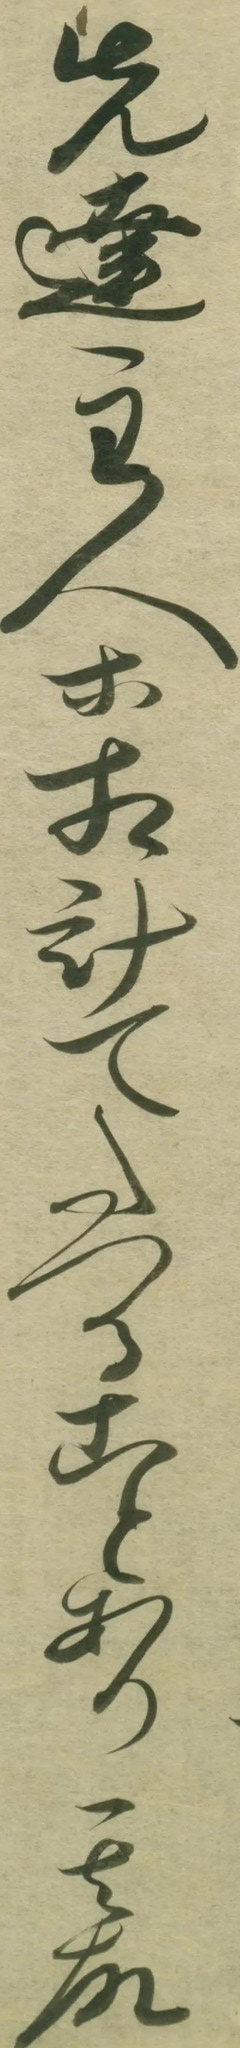先達主人等相計てたつることあり其故
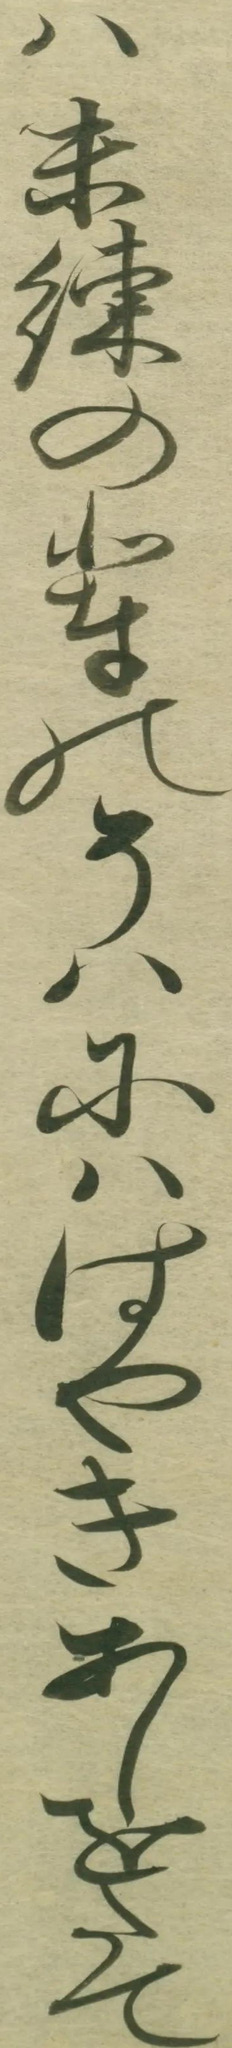は未練の輩のそはにははやきあしをたて
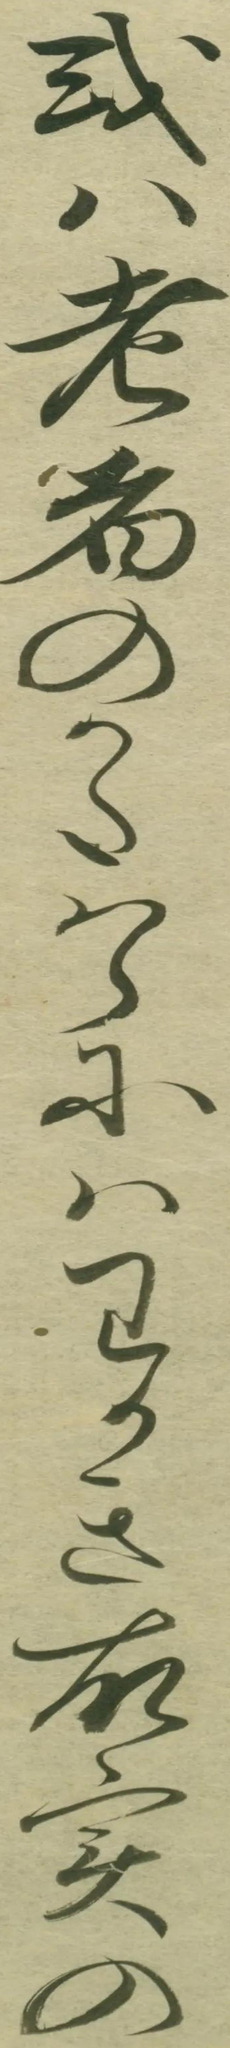或は老者のかたはらにはわかき故実の
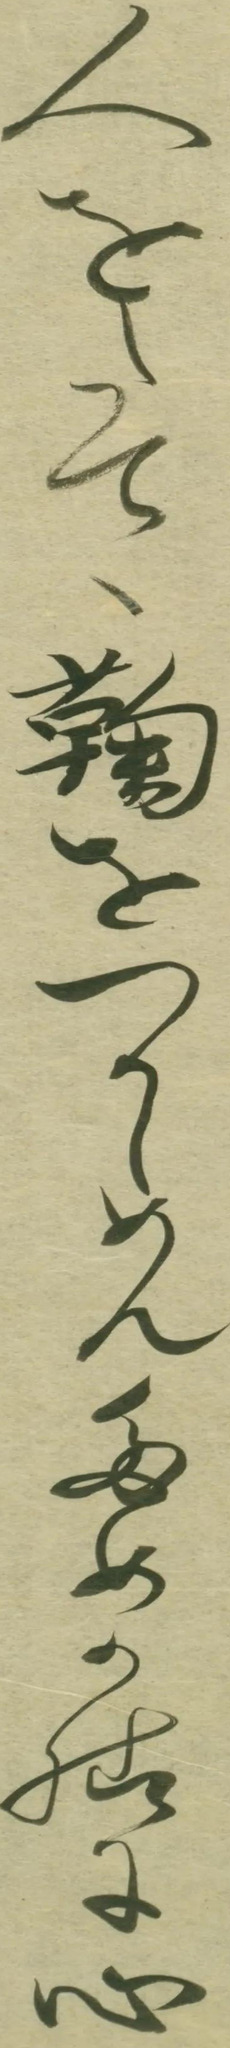人をたてゝ鞠をつかしめんための様に心
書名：蹴鞠之条々大概
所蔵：国立国会図書館 National Diet Library, JAPAN
